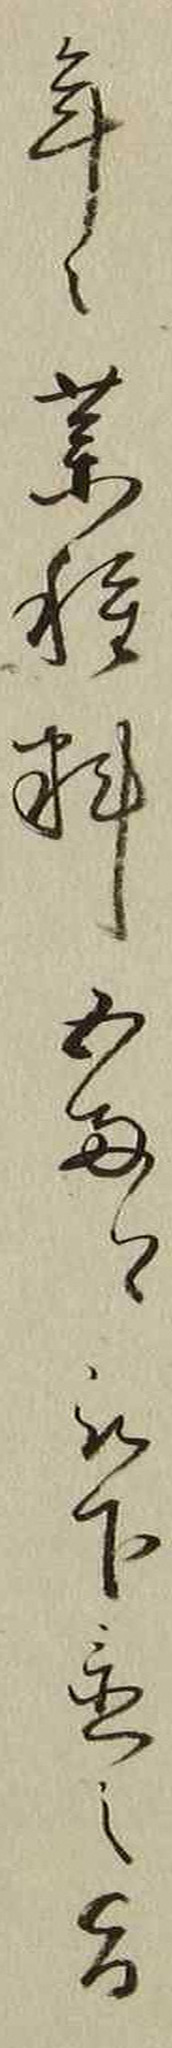年々薬種料五両ツヽ被下置之旨
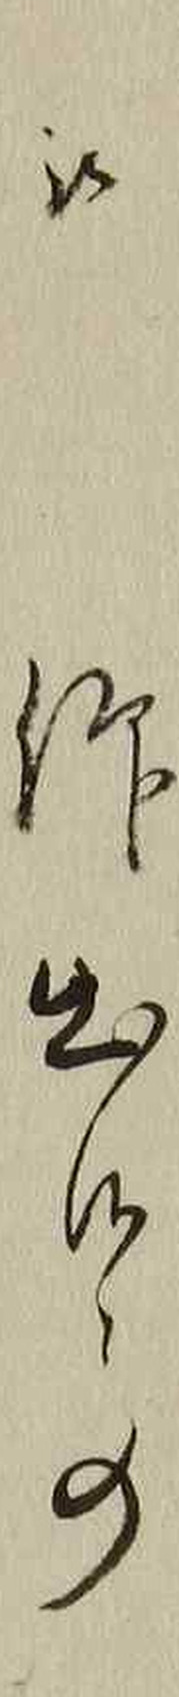被仰出候事
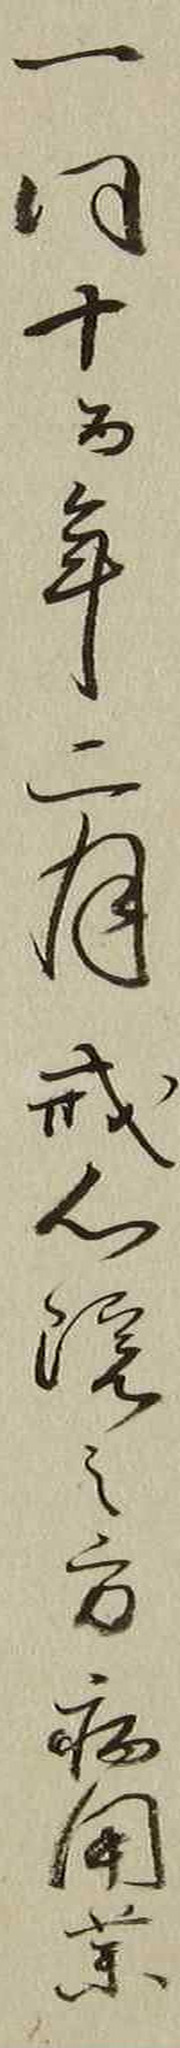一同十酉年二月戒心院之方病用薬
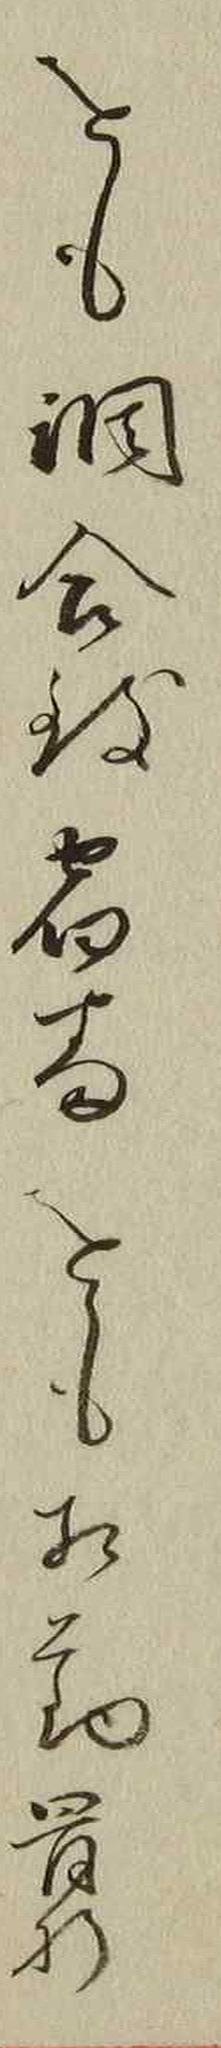をも調合致宿番をも相勤骨折
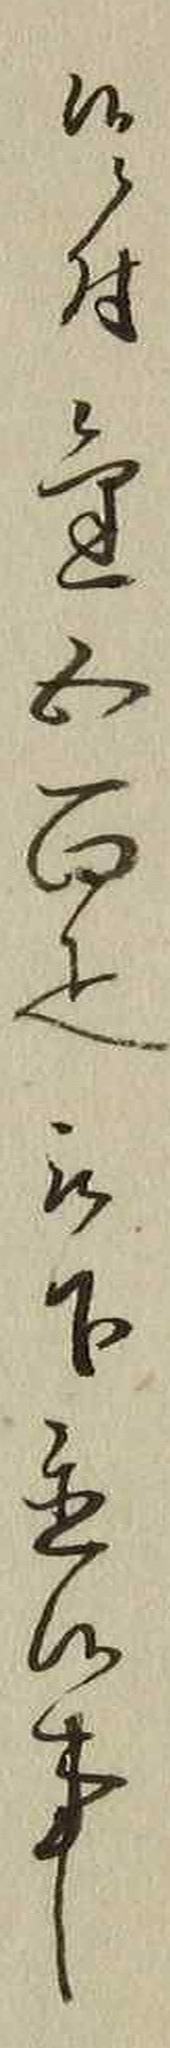候ニ付金五百疋被下置候事
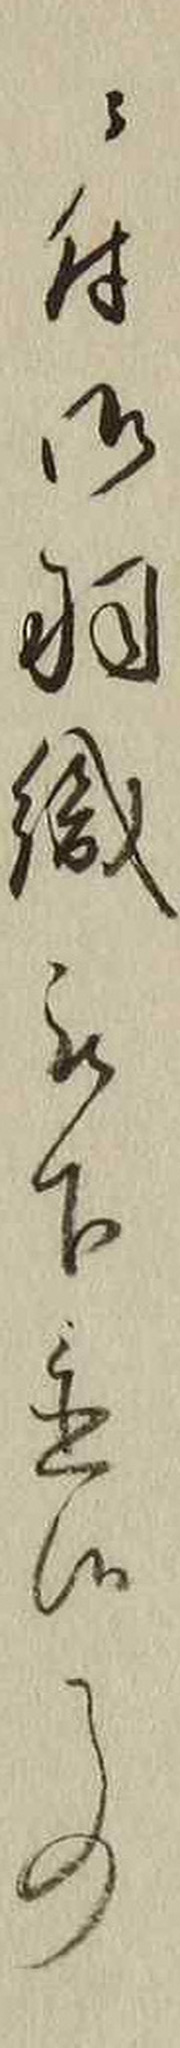ニ付御羽織被下置候事
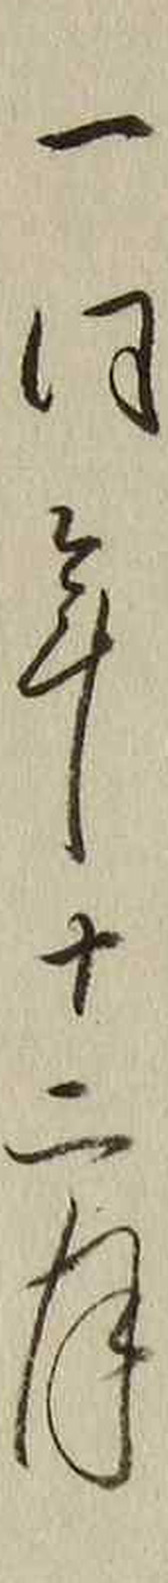一同年十二月
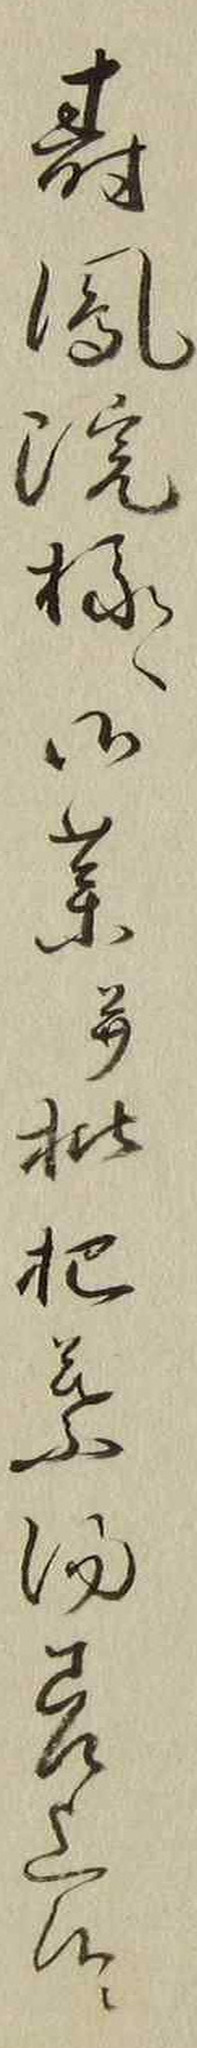寿鳳院様へ御薬并枇杷葉湯差上候ニ
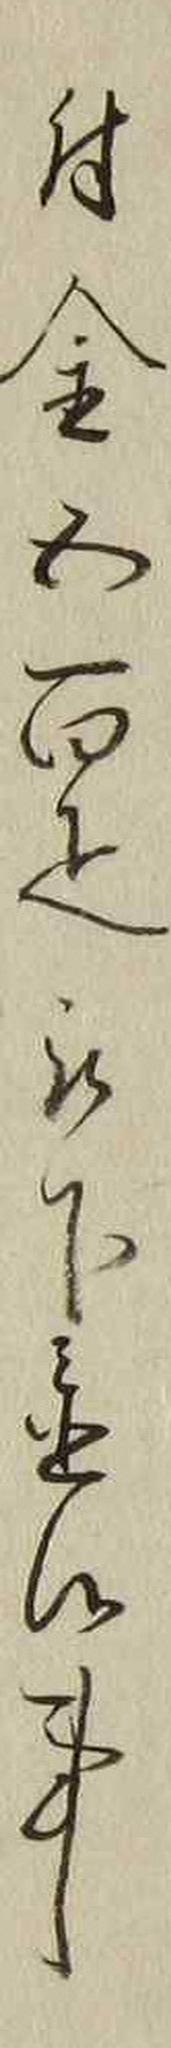付金五百疋被下置候事
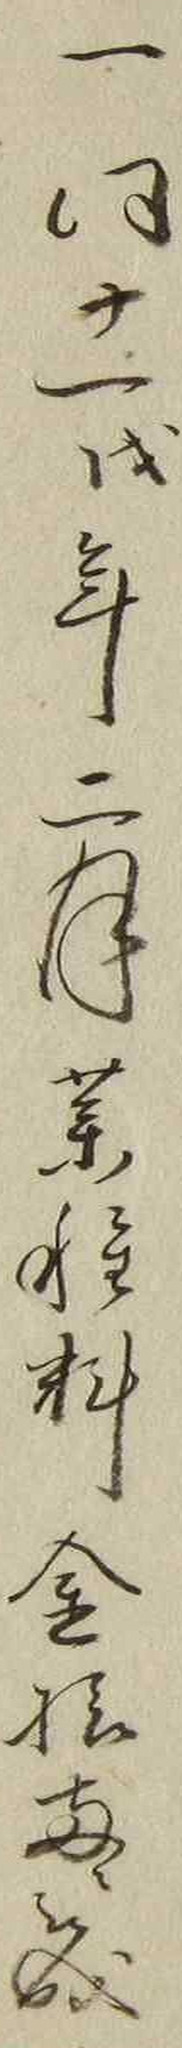一同十一戌年二月薬種料金拾両ニ被成
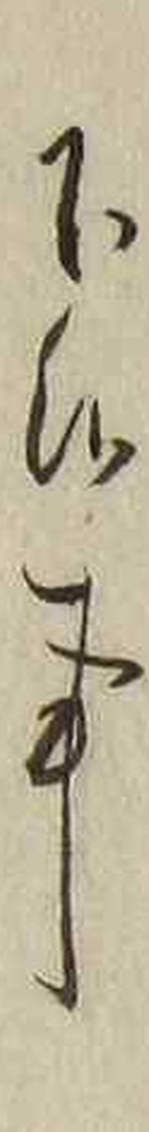下候事
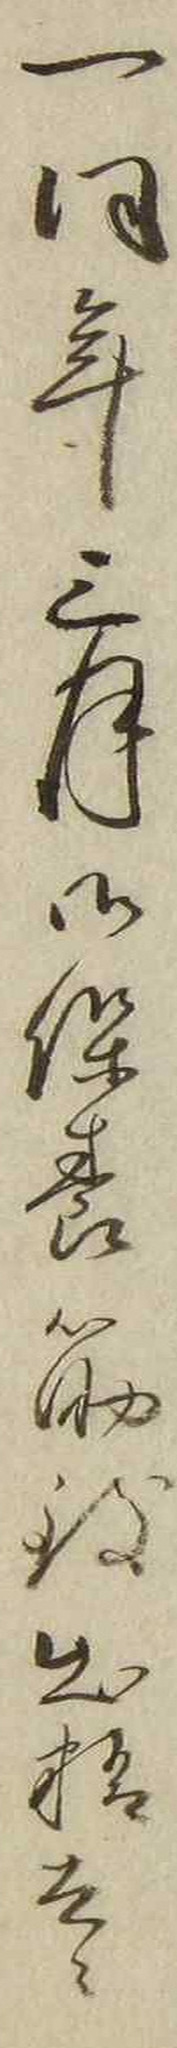一同年三月御保養筋致出精去々

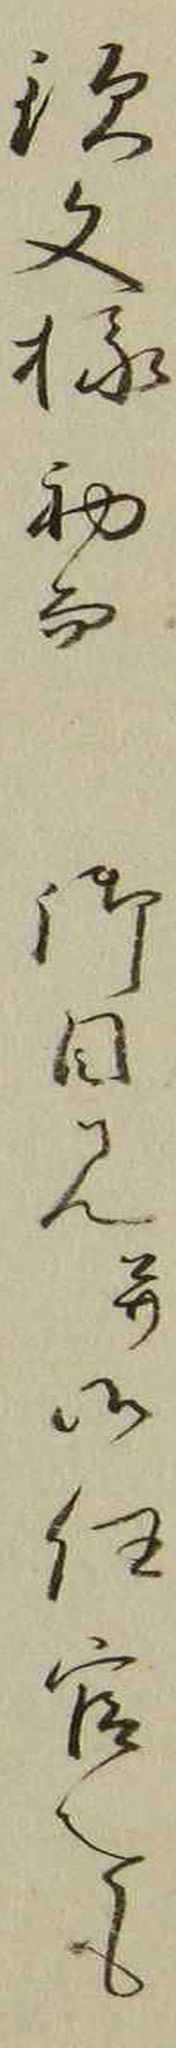欽文様初而御目見并御任官をも
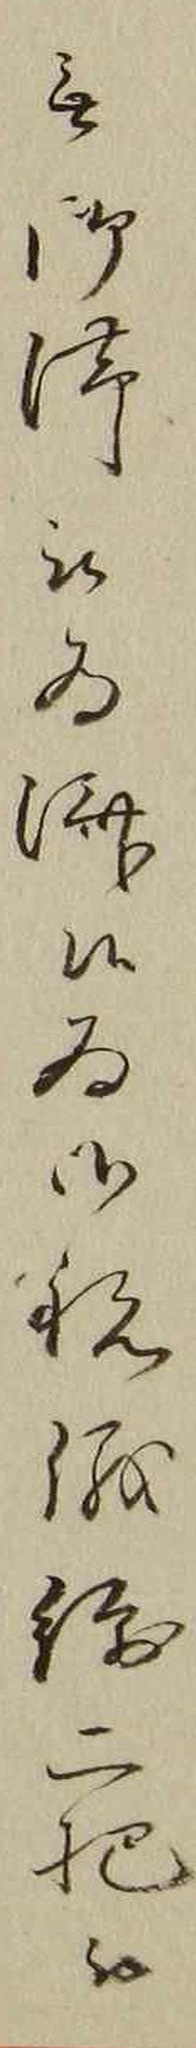無御滞被為済候為御祝儀綿二把被
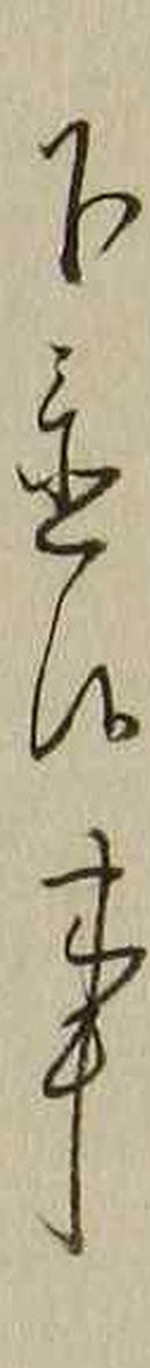下置候事
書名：諸士系譜　巻之8　い之部8
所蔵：会津若松市立会津図書館
